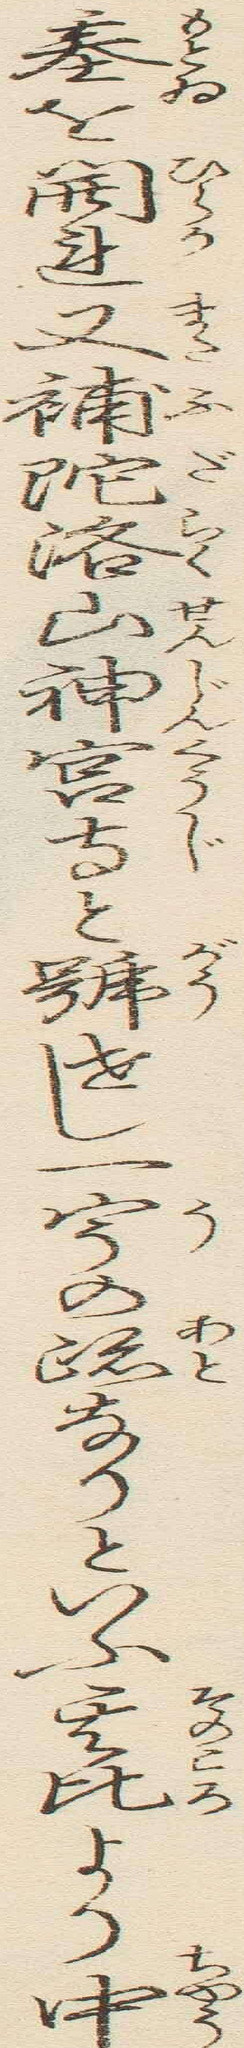基を開れ又補陀洛山神宮寺と號せし一宇の跡なりといふ其比より中
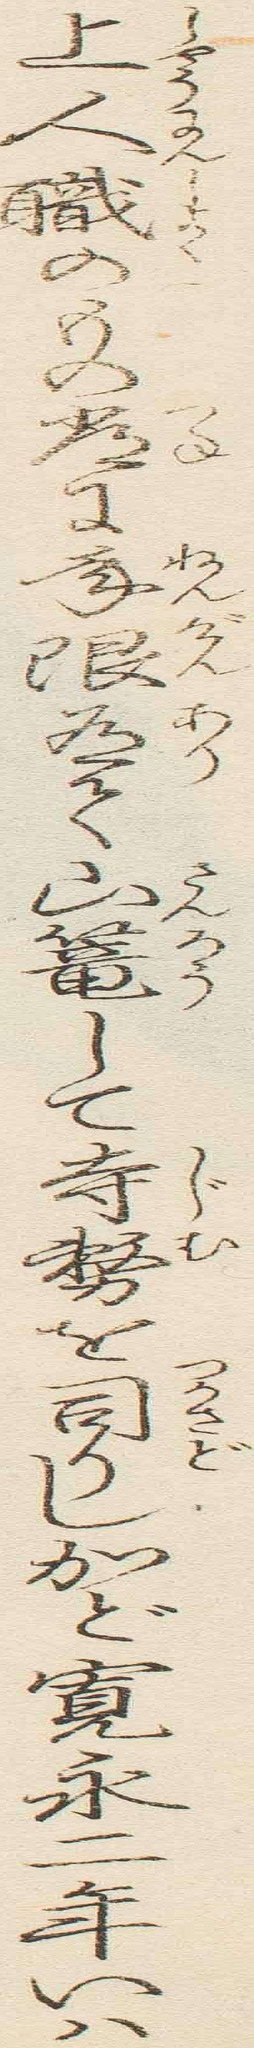上人職のもの常に年限有て山篭して寺務を司りしかど寛永二年いは
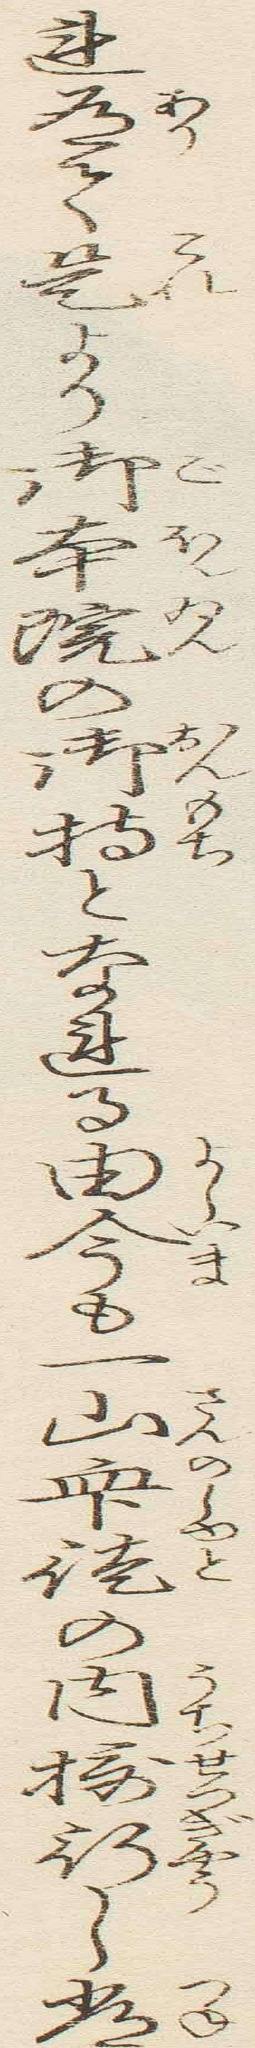れ有て是より御本院の御持となれる由今も一山衆徒の内摂行し常
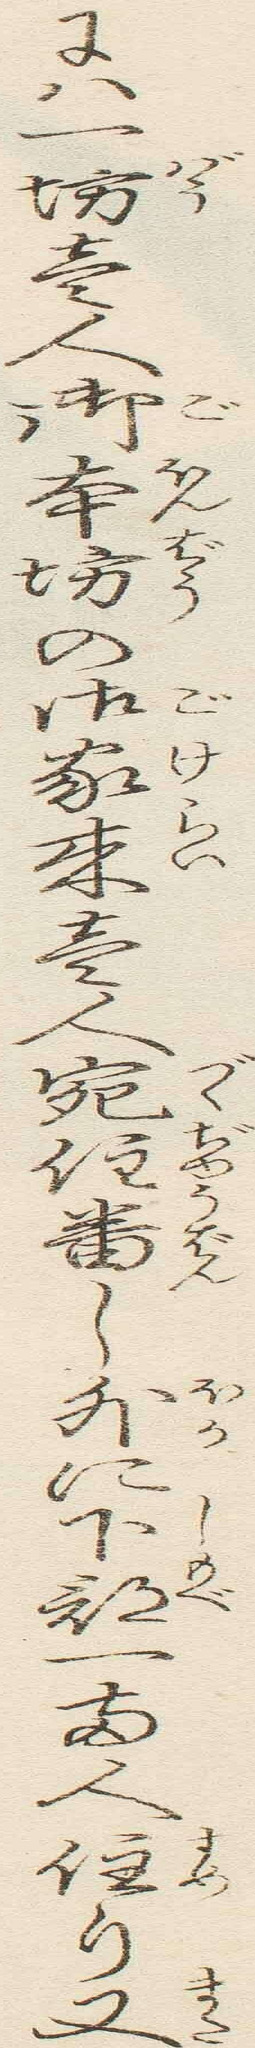には一坊壱人御本坊の御家來壱人宛住番し外に下部一両人住り又
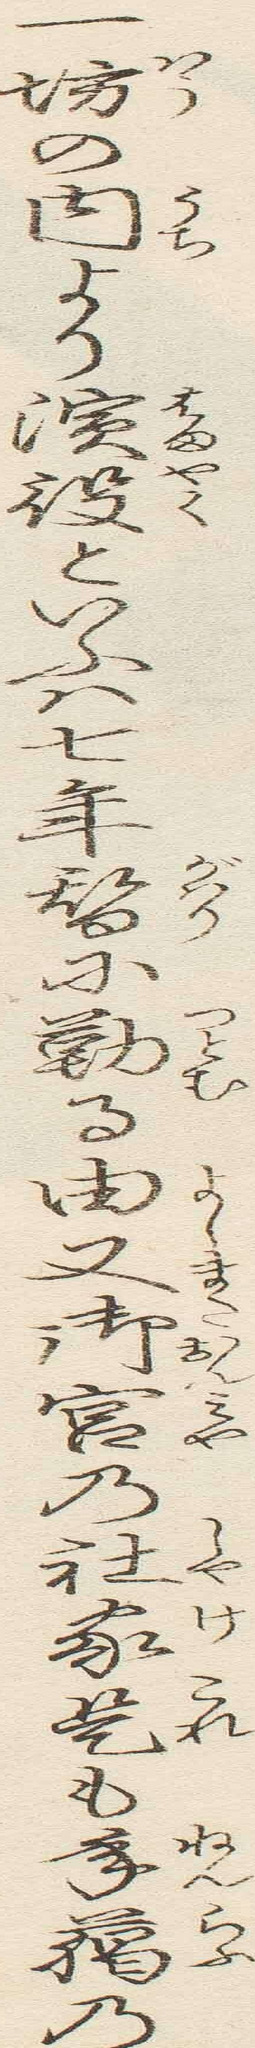一坊の内より濱役といふは七年替に勤る由又御宮の社家是も年﨟の
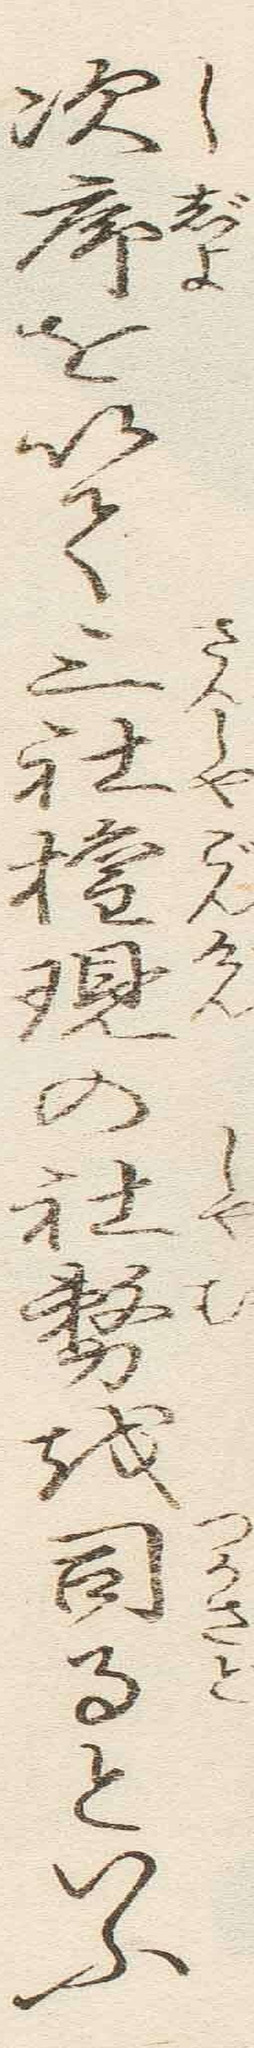次序を以て三社權現の社務を司るといふ
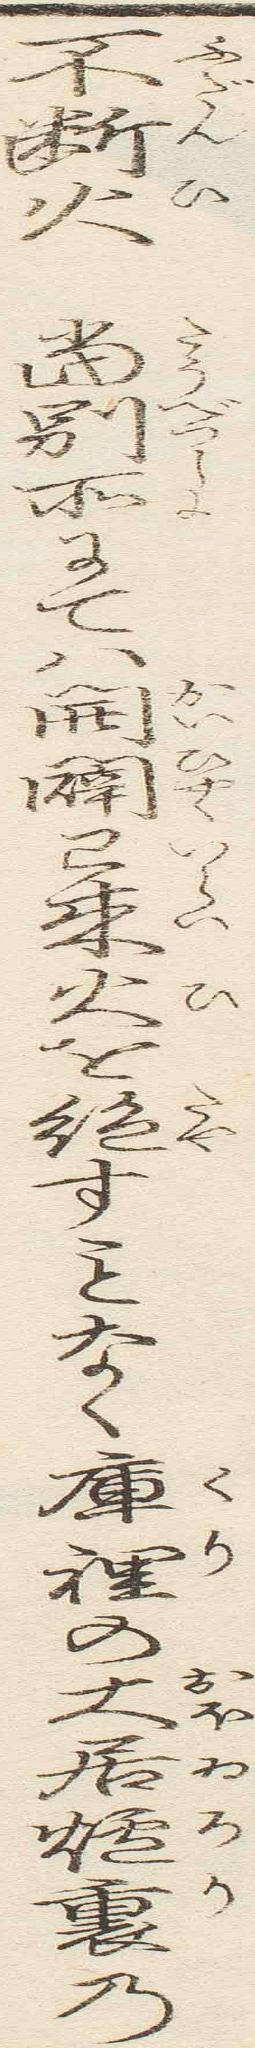不断火當別所にては開闢已來火を絶すことなく庫裡の大居爐裏の
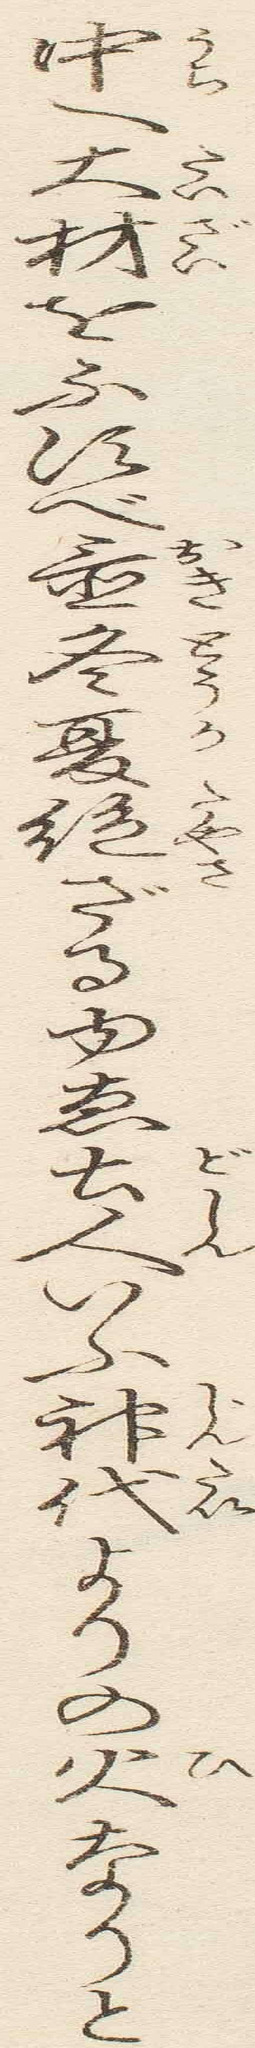中へ大材をふすべ置冬夏絶ざるゆゑ土人いふ神代よりの火なりと
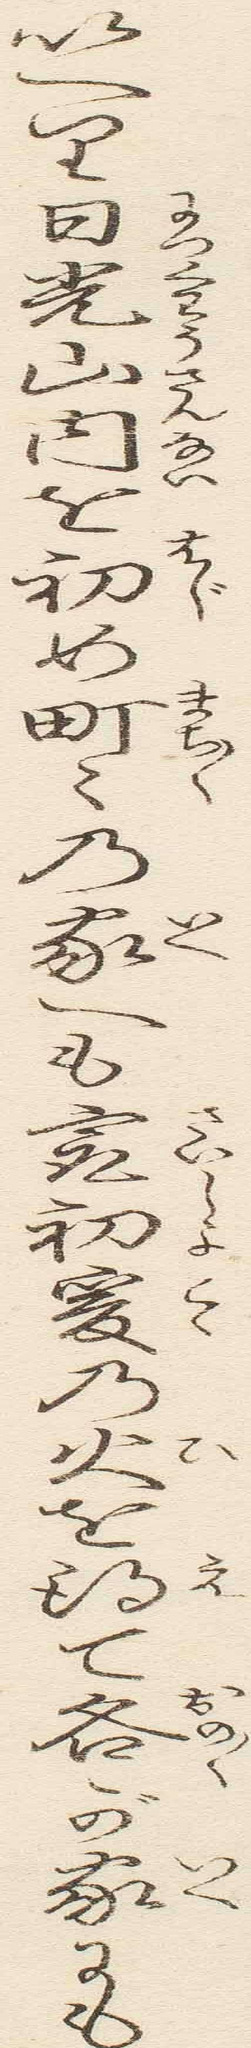いへり日光山内を初め町〻の家へも最初爰の火を得て各が家にも
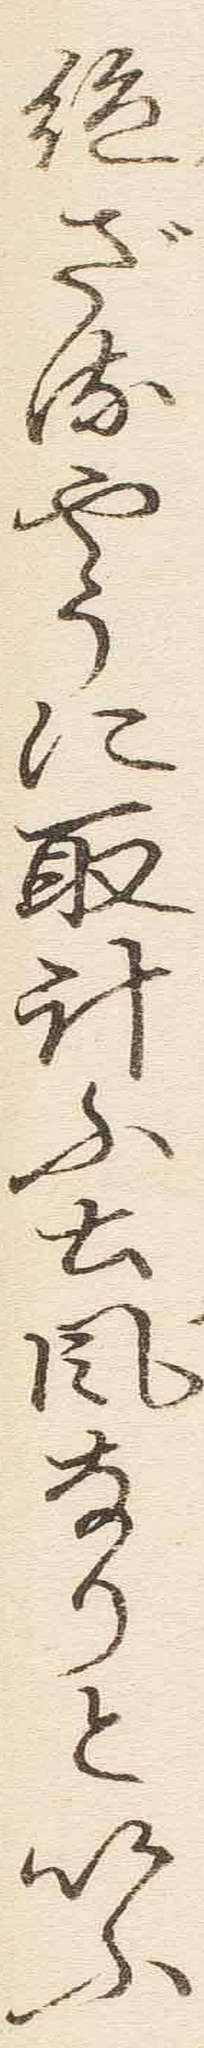絶ざるやうに取計ふ土風なりといふ
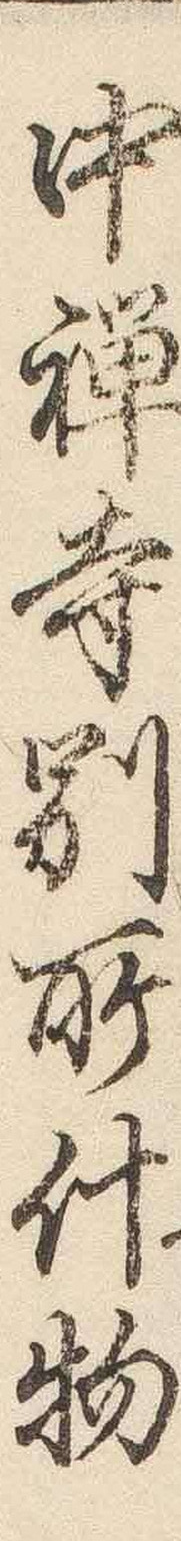中禅寺別所什物
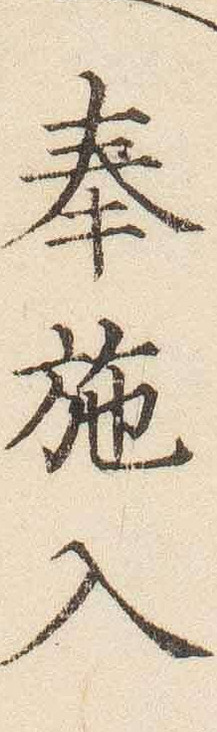奉施入
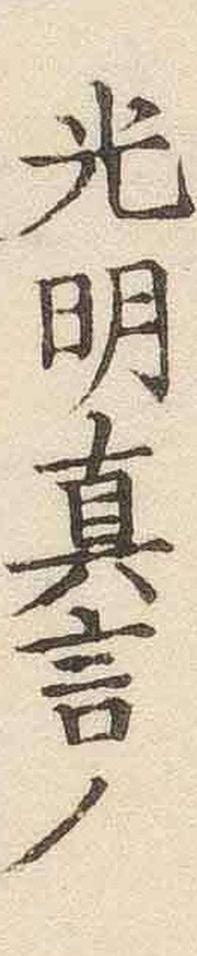光明真言ノ
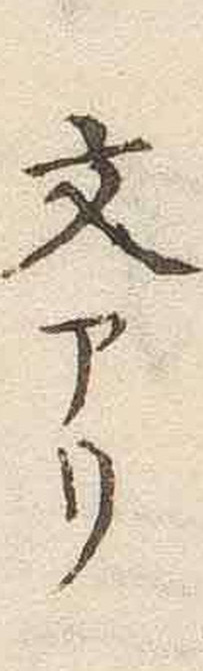文アリ
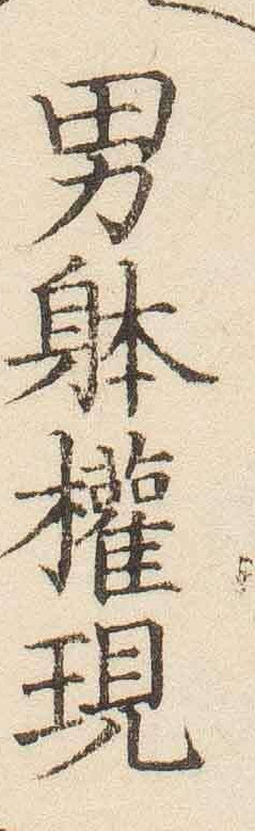男躰權現
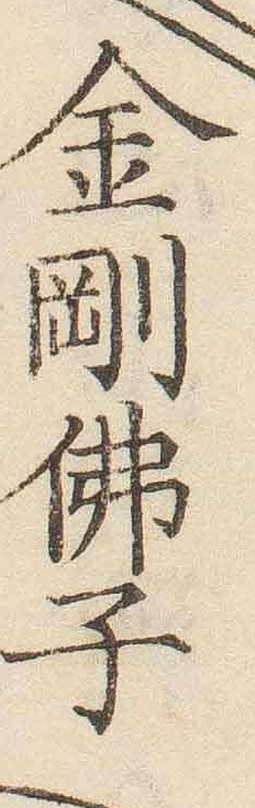金剛佛子
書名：日光山志
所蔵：東京学芸大学附属図書館 国文学研究資料館
